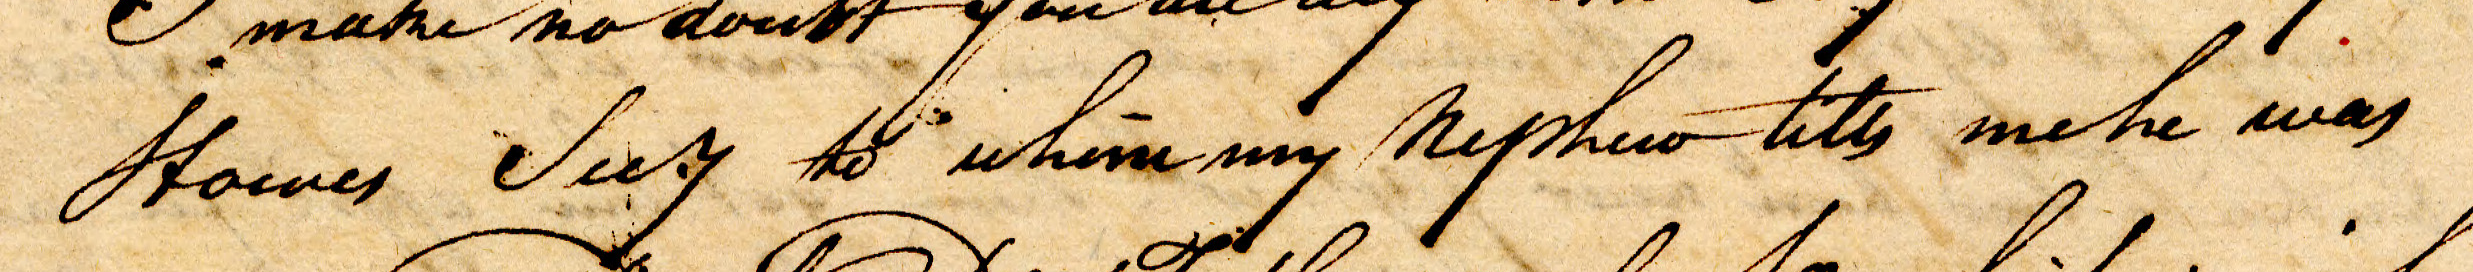Howes Sec^y. to whom my Nephew tells me he was
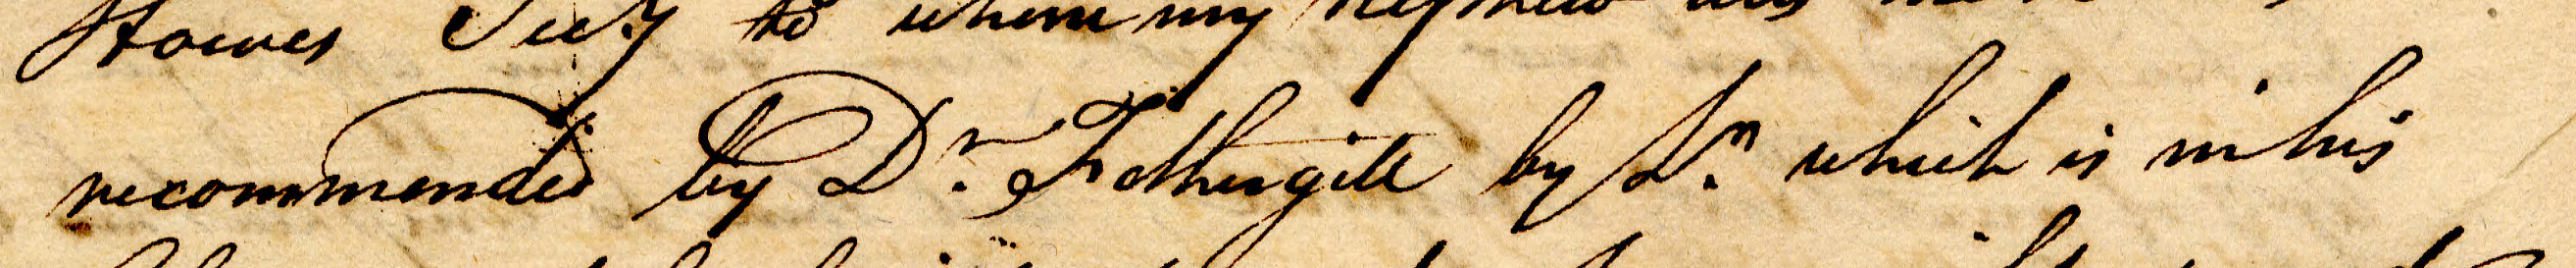recommended by D^r. Fothergill by L^n. which is in his
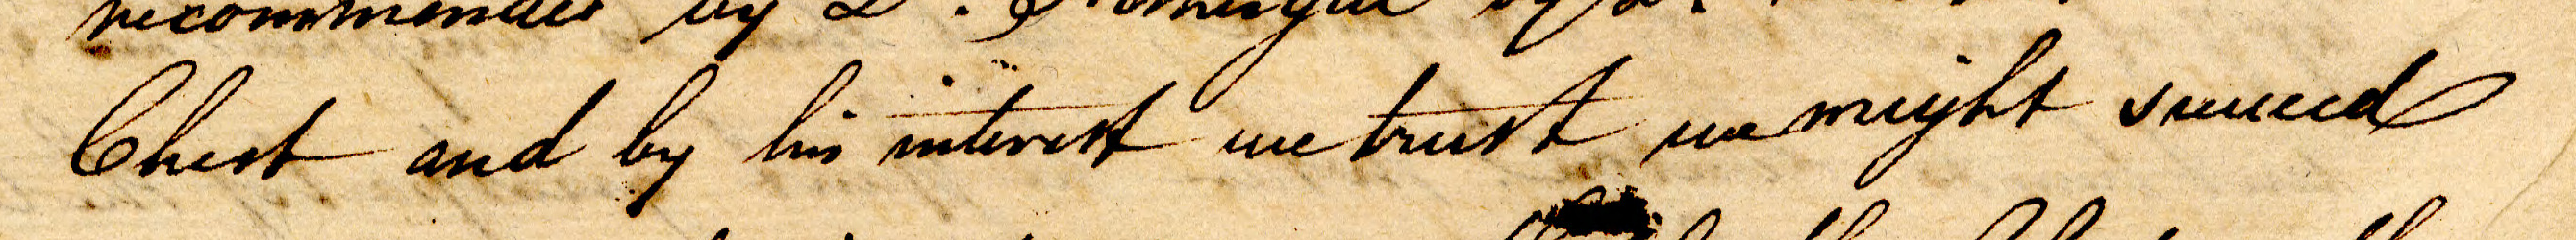Chest and by his interest we trust we might succeed
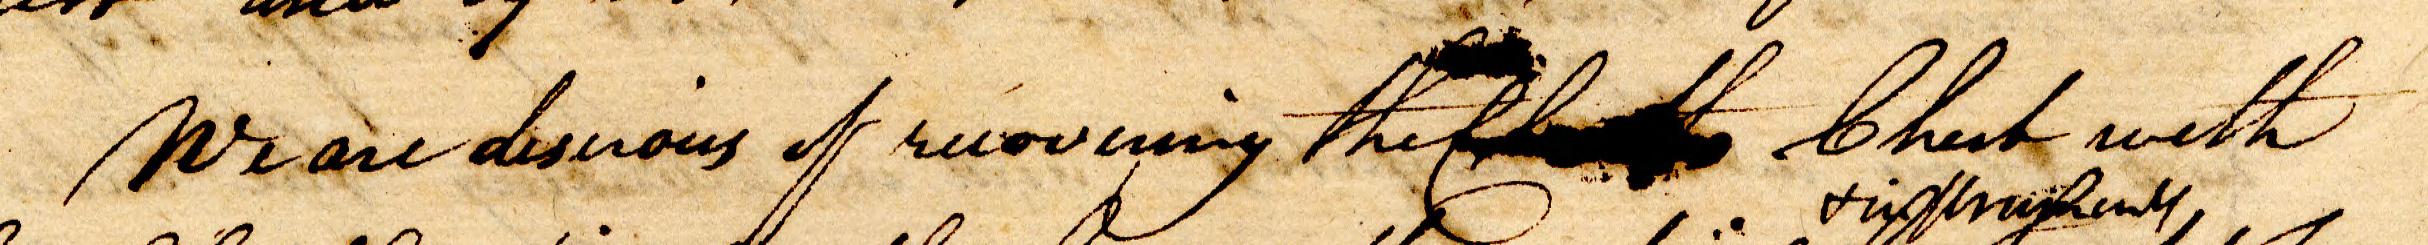We are desirous of recovering the [Cloaths] Chest with
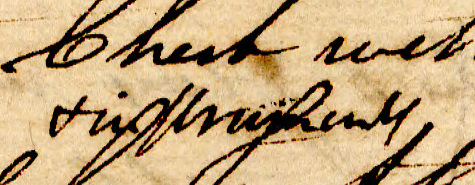& instruments
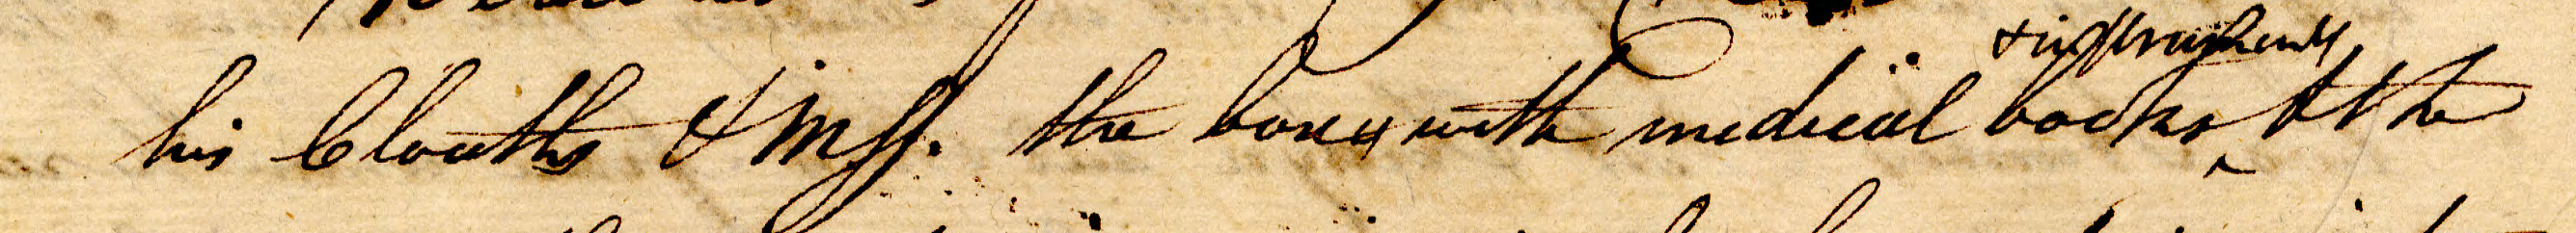his Cloathes & M.S.S. the boxes with medical books ^ & the
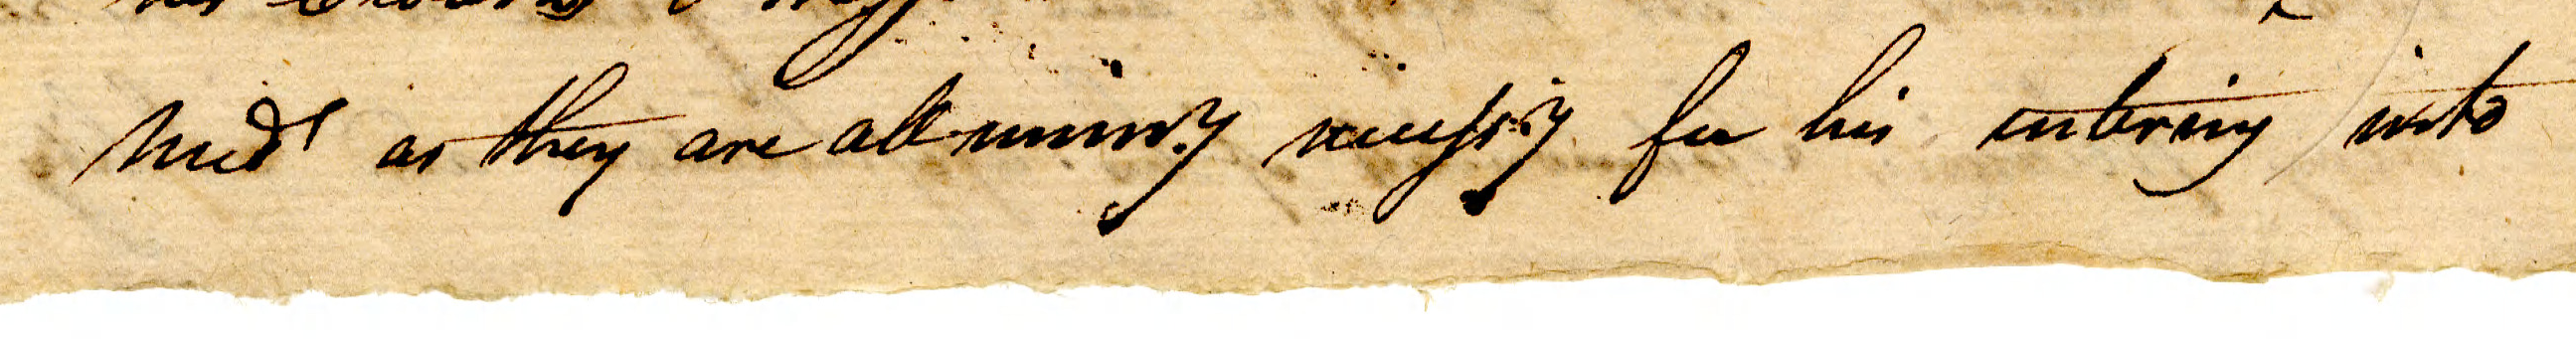Med^s as they are all ninn^y. necess^y. for his entering into
